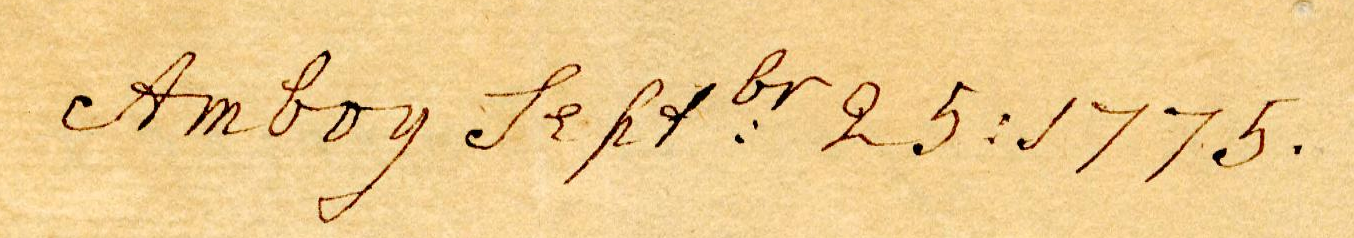Amboy Sept^br: 25: 1775.
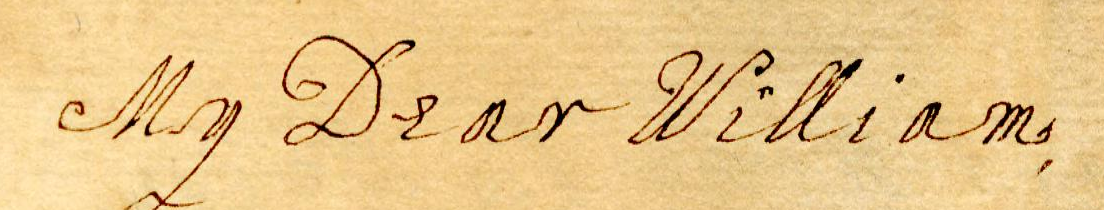My Dear William,
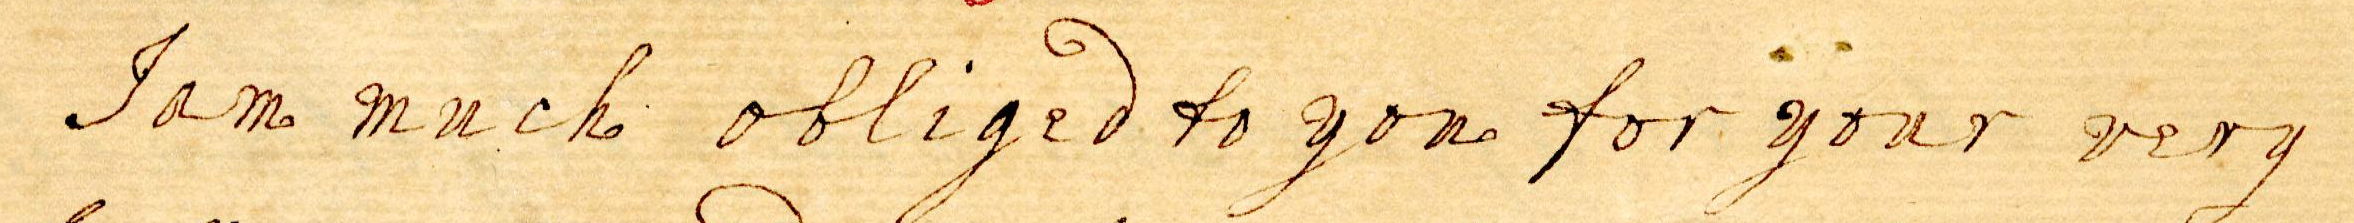I am much obliged to you for your very
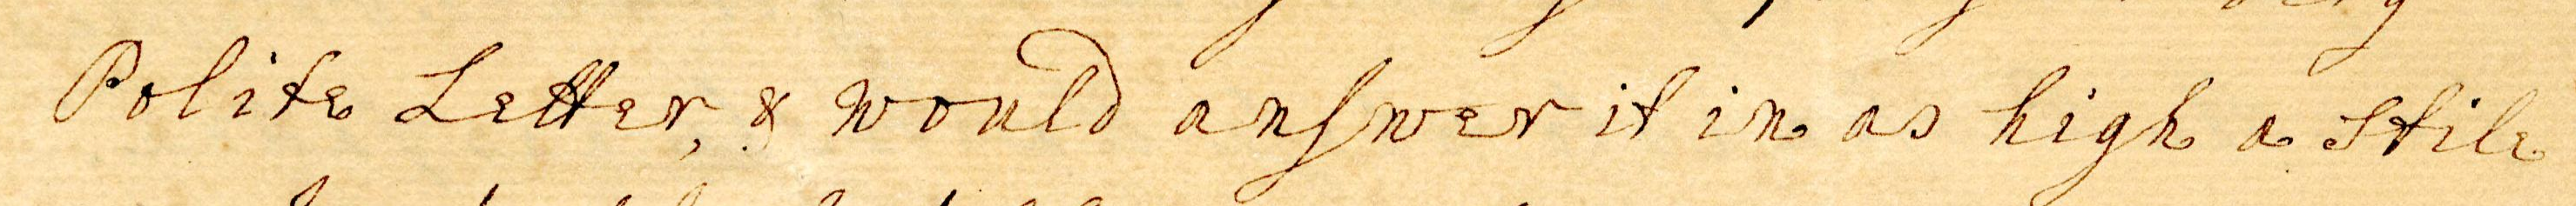Polite Letter, & would answer if in as high a Stile
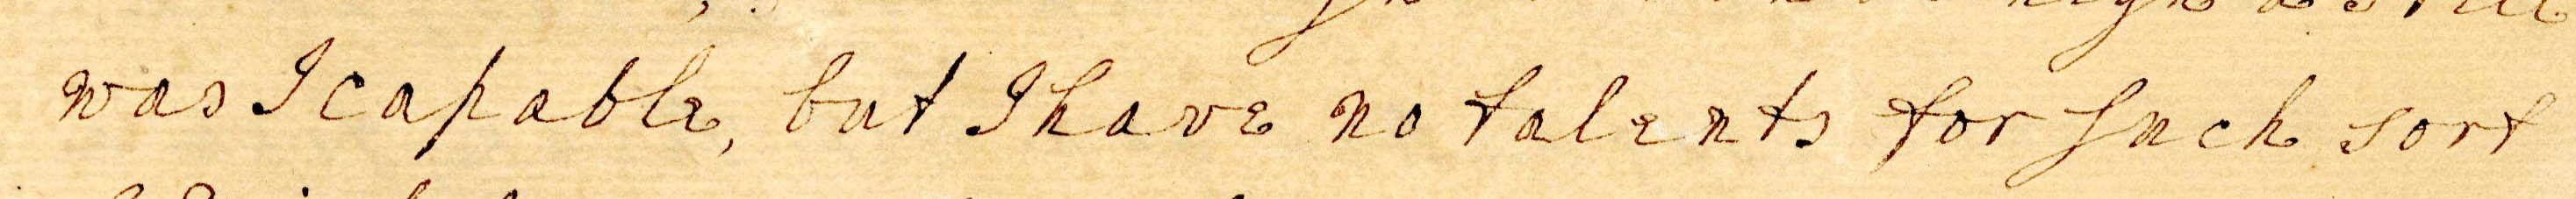was I capable, but I share no talents for such sort
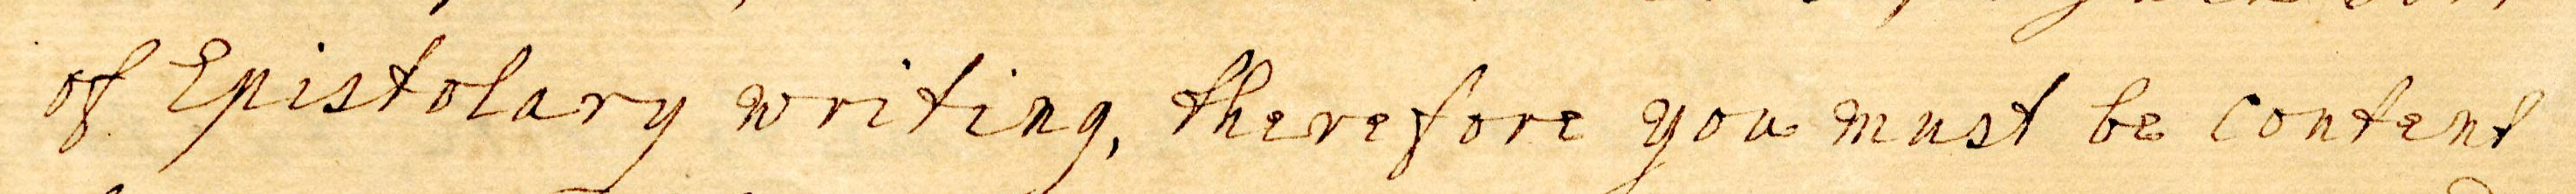of Epistolary writing, therefore you must be content
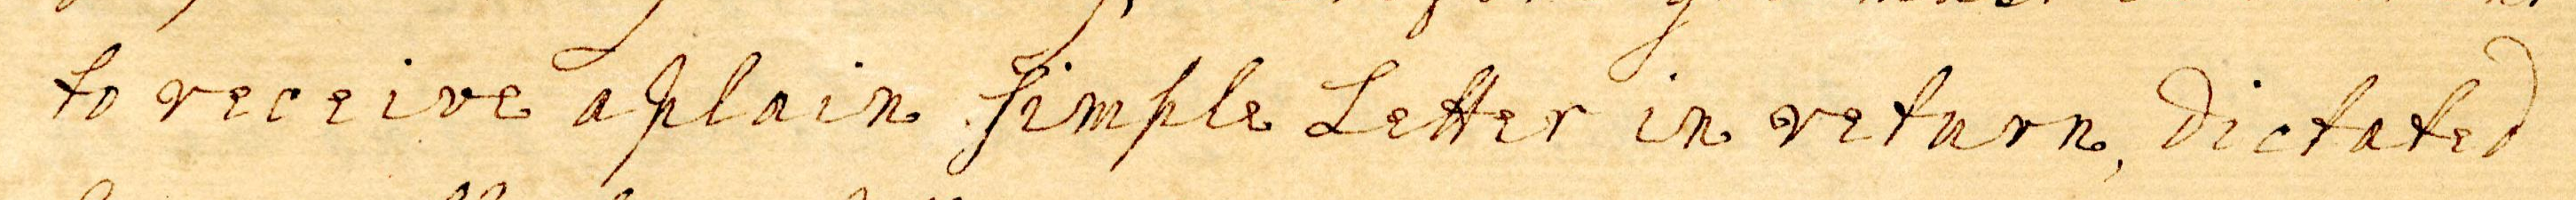to receive a plain simple Letter in return, dictated
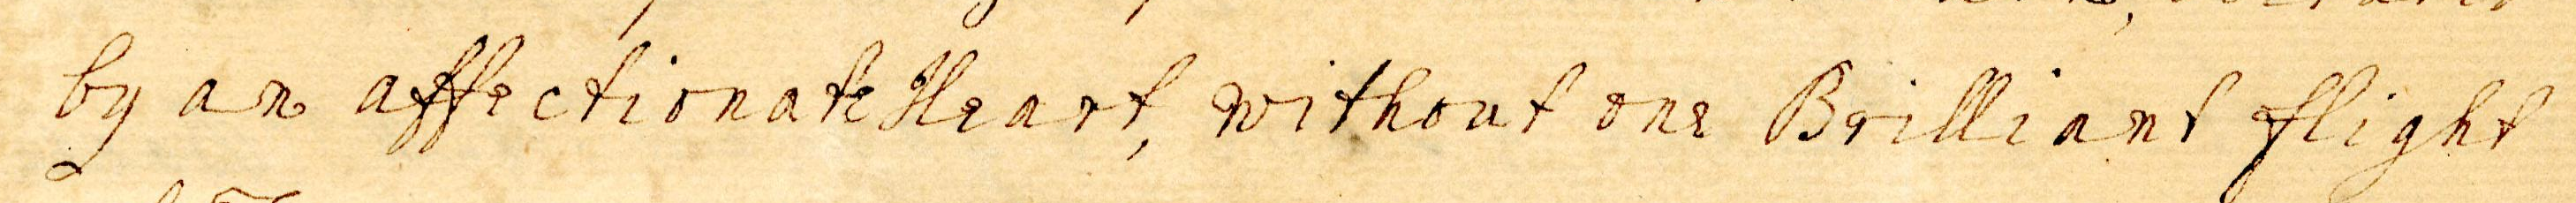by an affectionate Heart, without one Brilliant flight
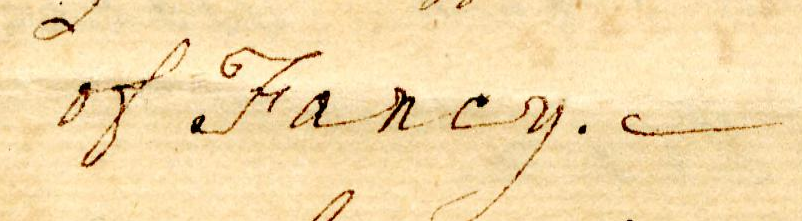of Fancy.-
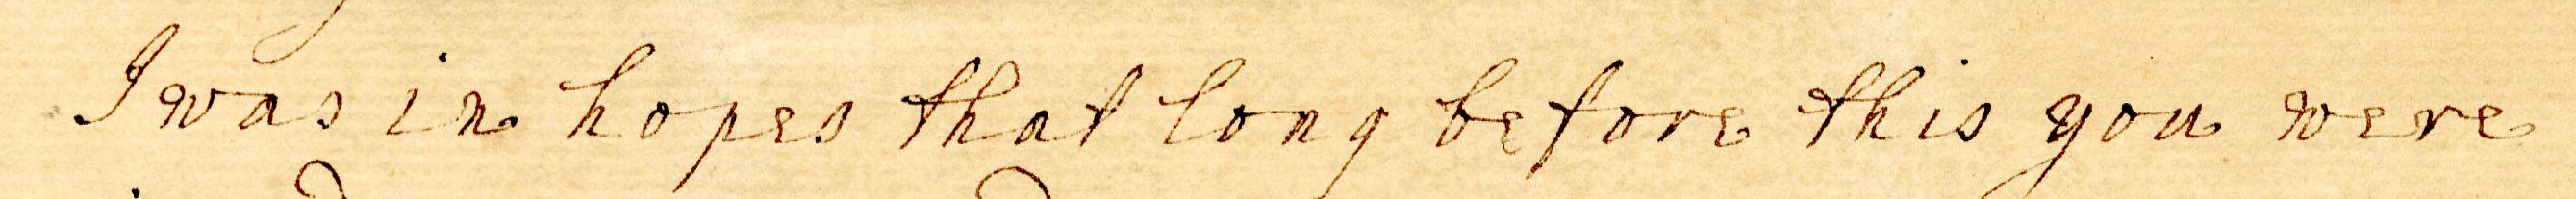I was in hopes that long before this you were
